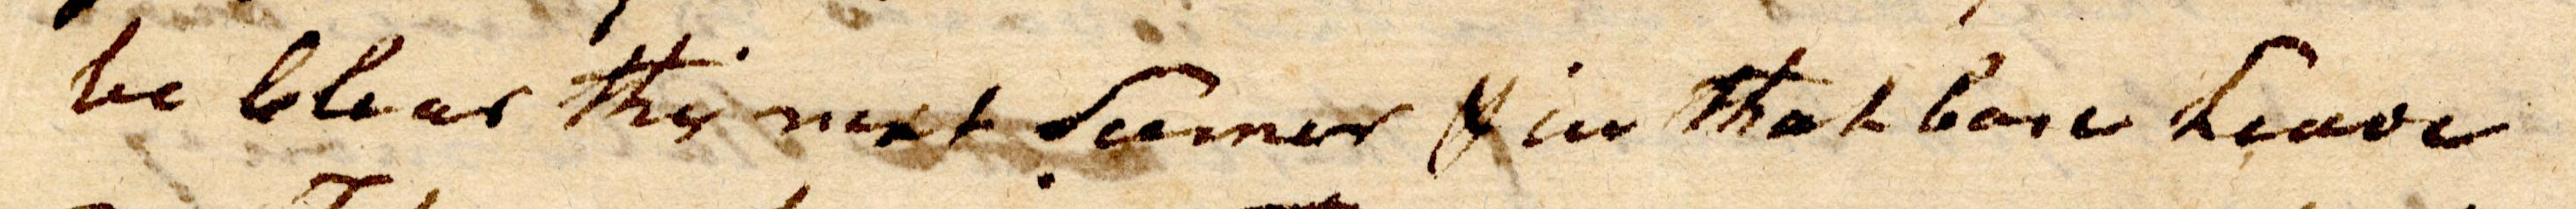be Clear this next Sumer & in that case Leave
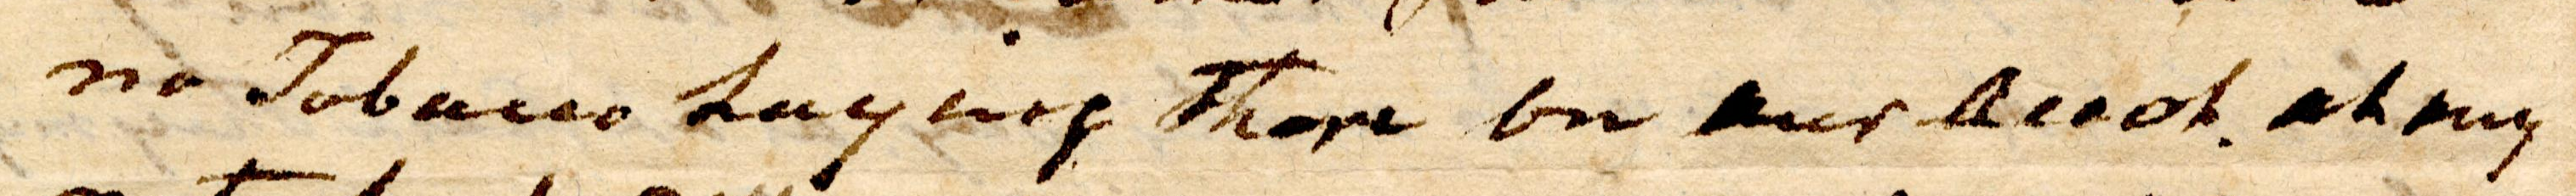no Tobacco Laying there on our Accot. at my
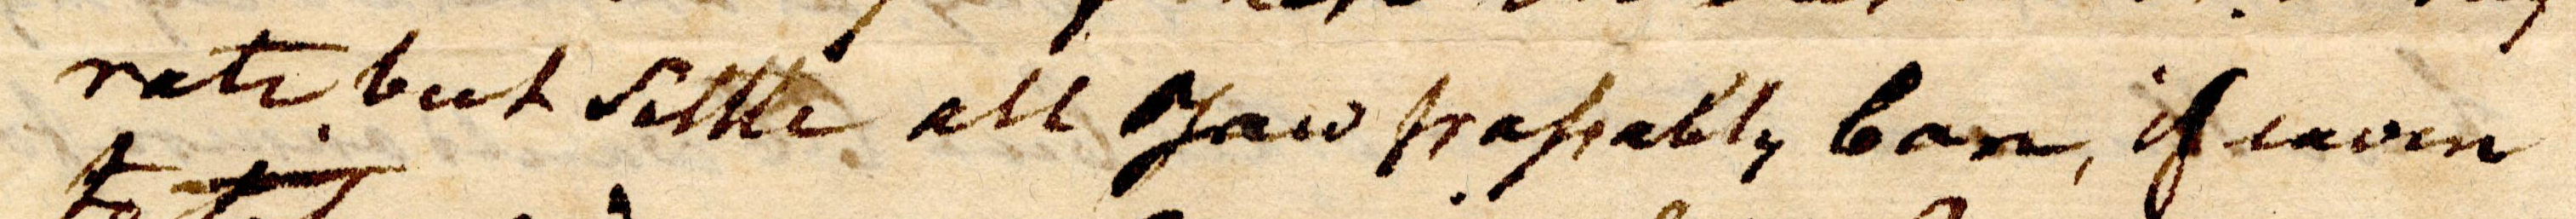rate but settle all you passably Can, if eaven
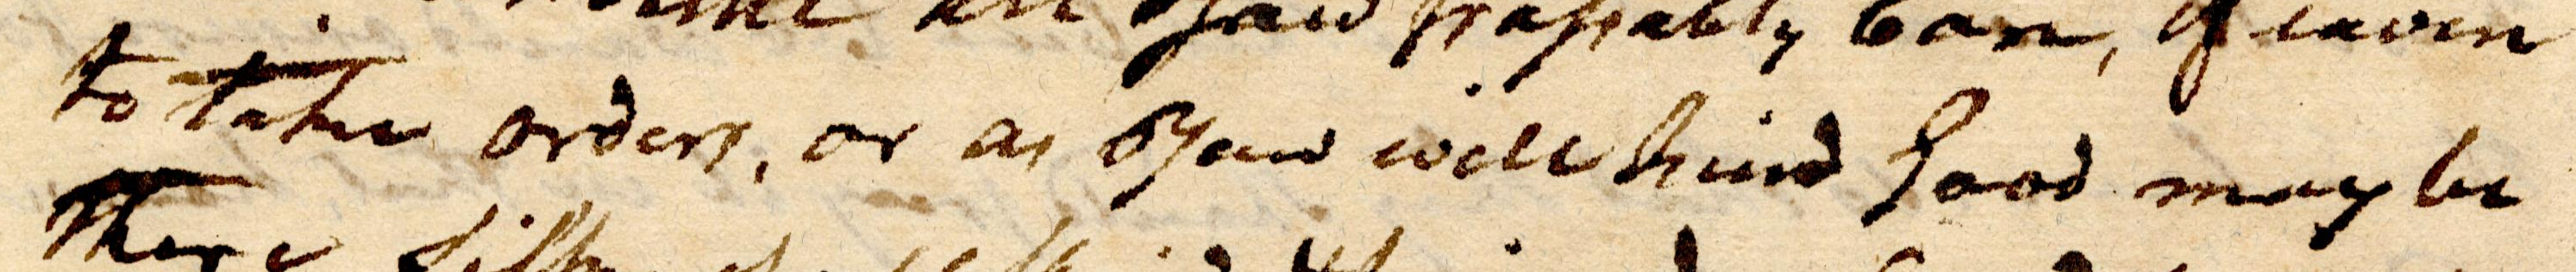to take orders, or as you will kind Good may be
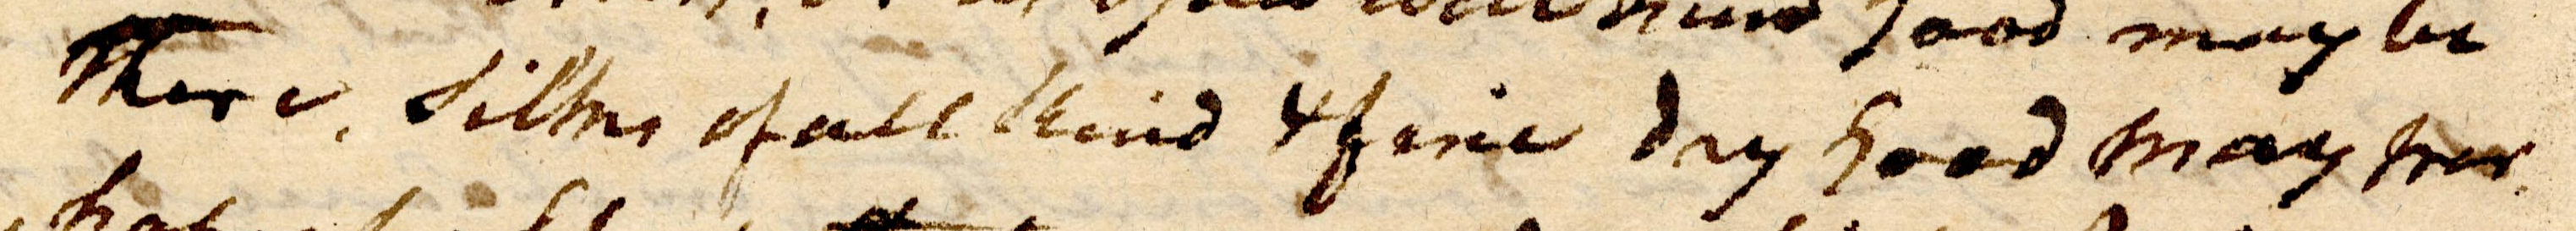there, silks of all send & fine dry good may ever
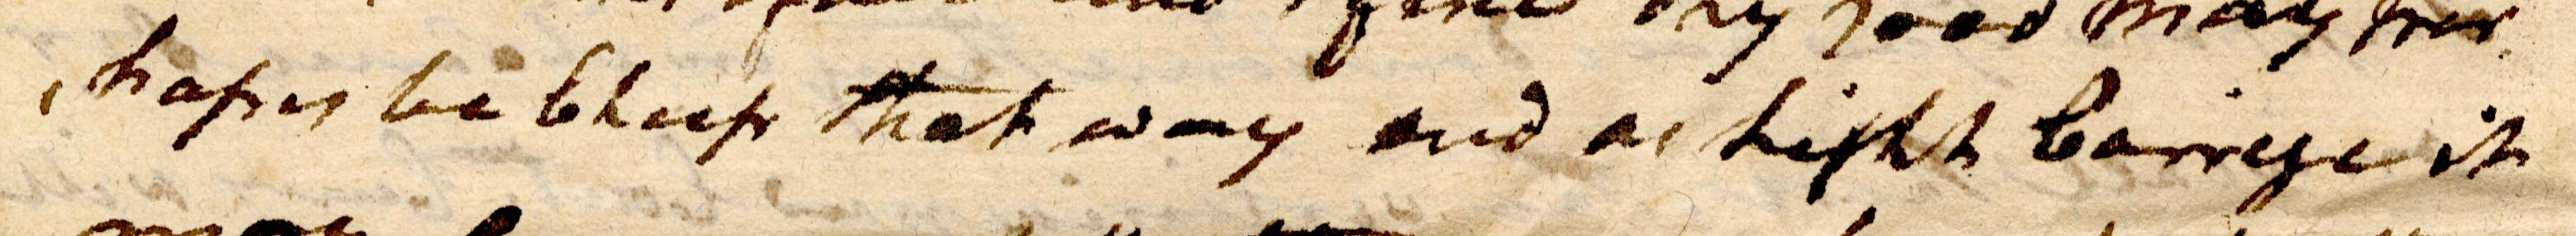hopes be cheap that way and as Light Carrige it
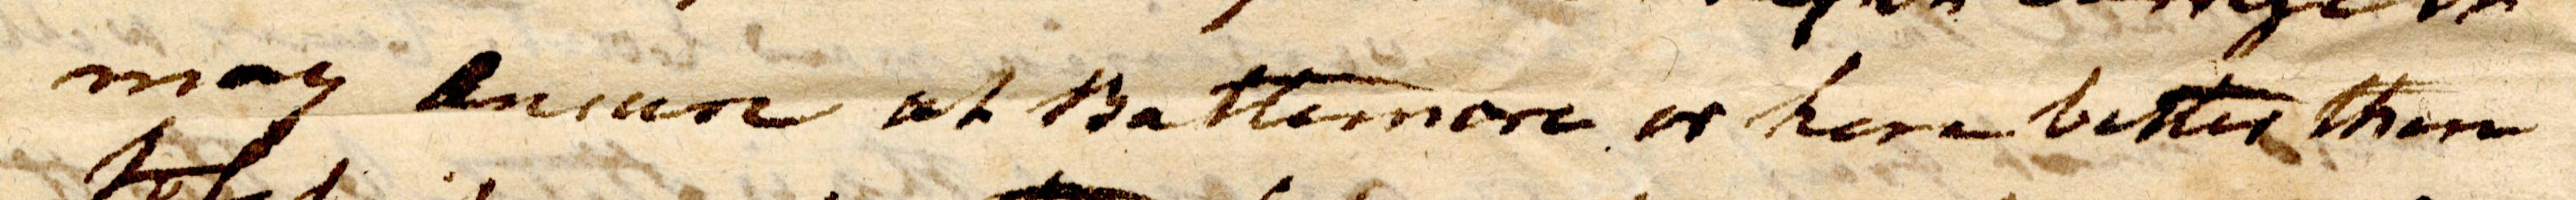may Assure at Baltimore is here better there
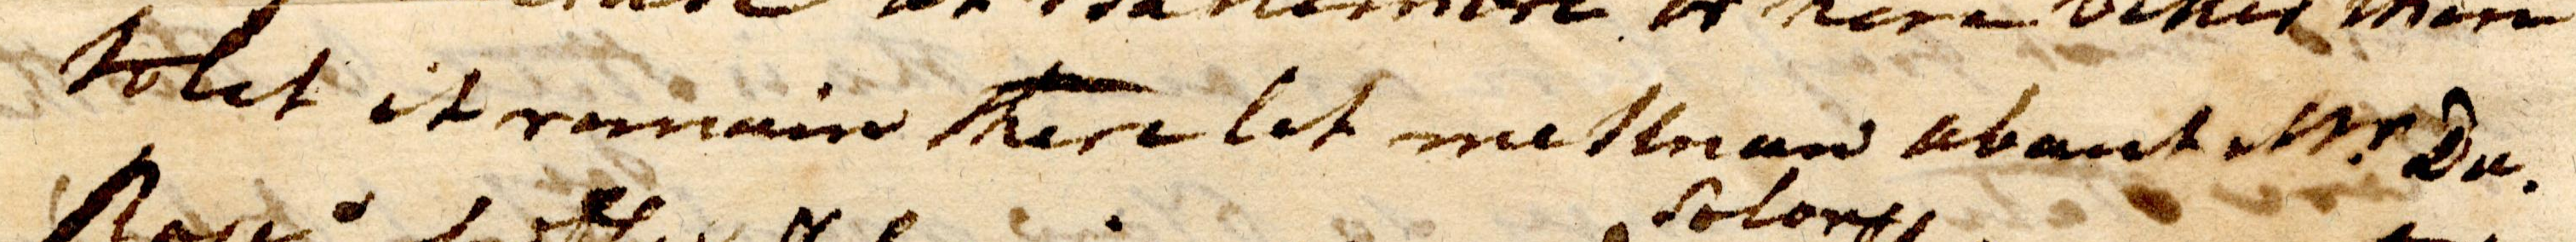to let it remain there let me know about M^r. Du.
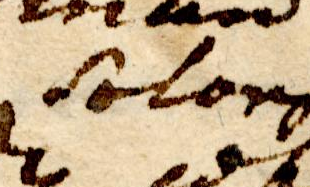so lost
